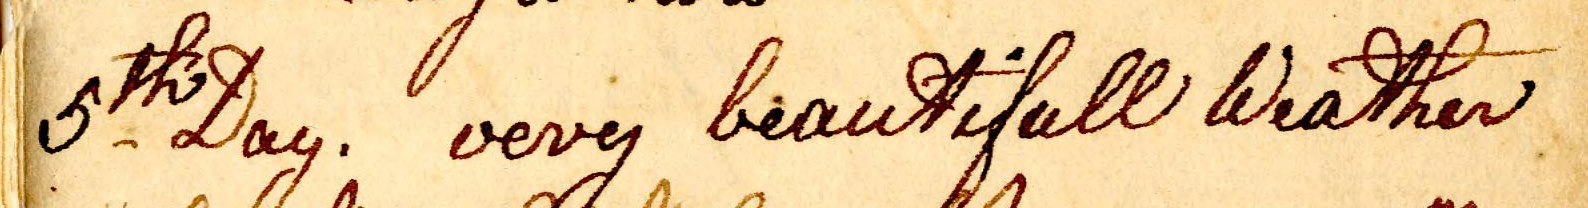5^th Day. very beautifull Weather
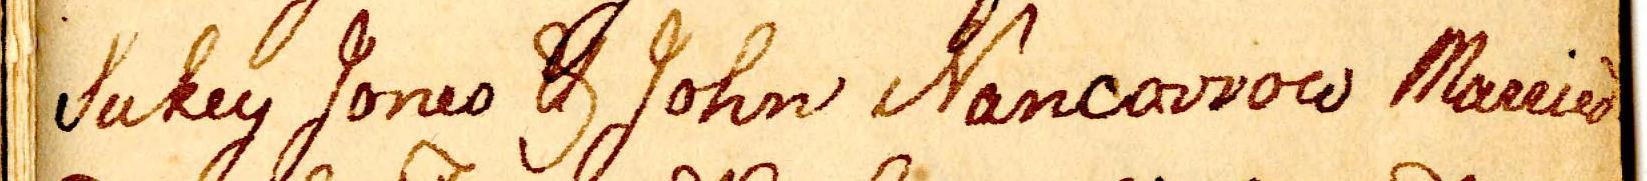Sukey Jones & John Nancarrow Married
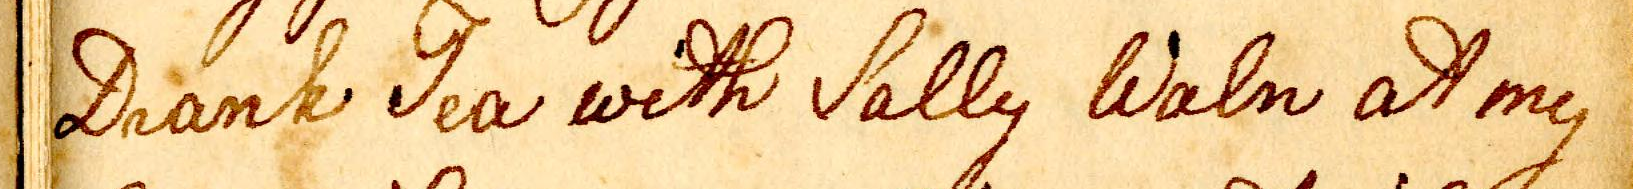Drank Tea with Sally Waln at my
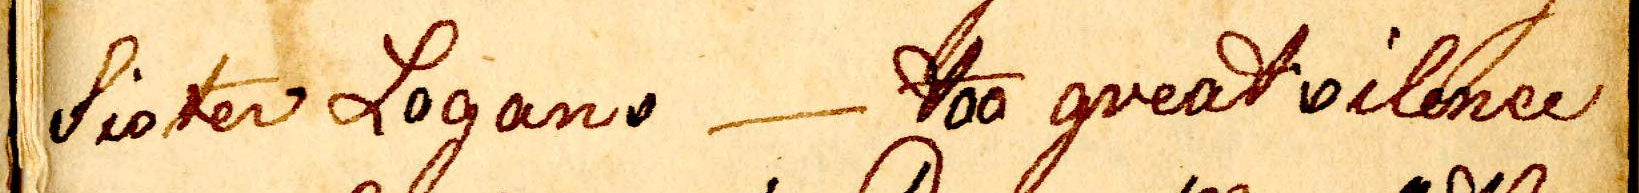Sister Logans- too great silence
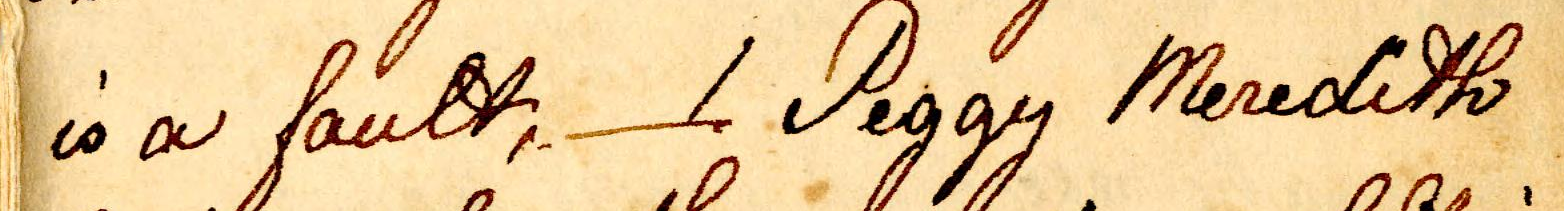is a fault,- Peggy Meredith
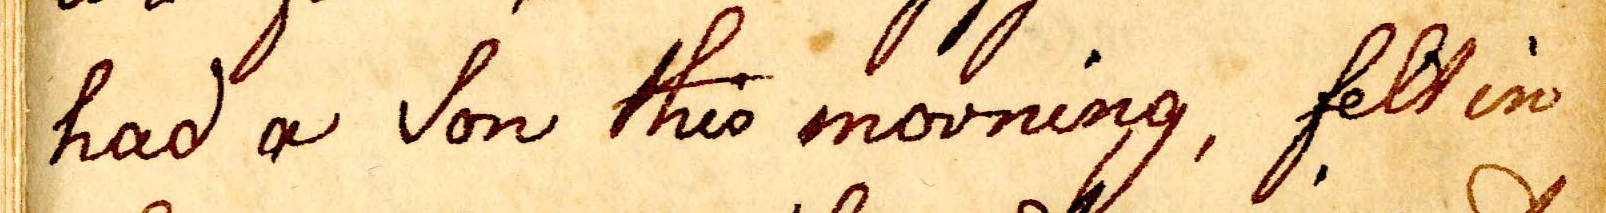had a Son this morning, felt in
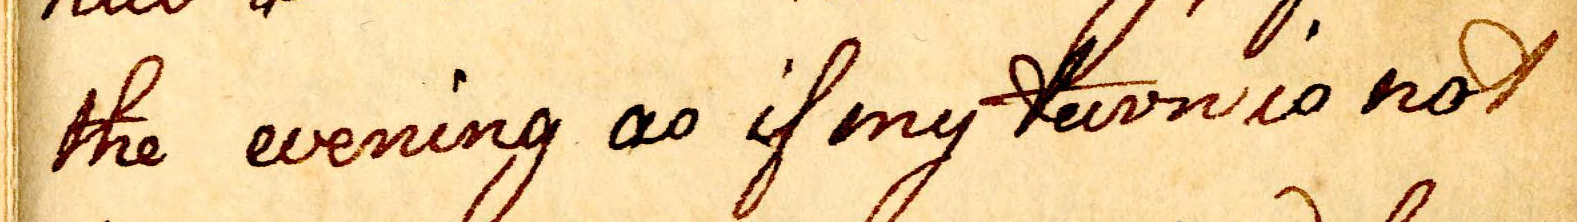the evening as if my turn is not
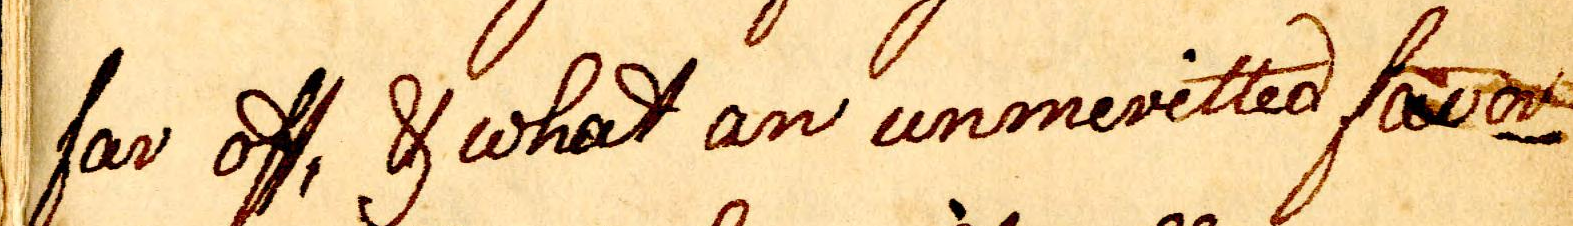far off, & what an unmeritted favor
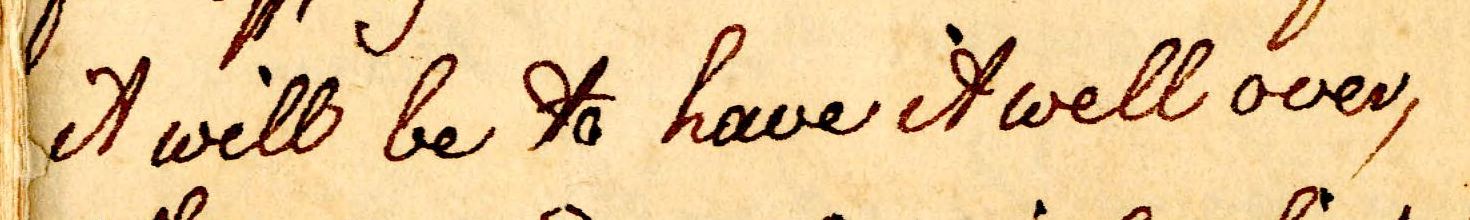it will be to have it well over,
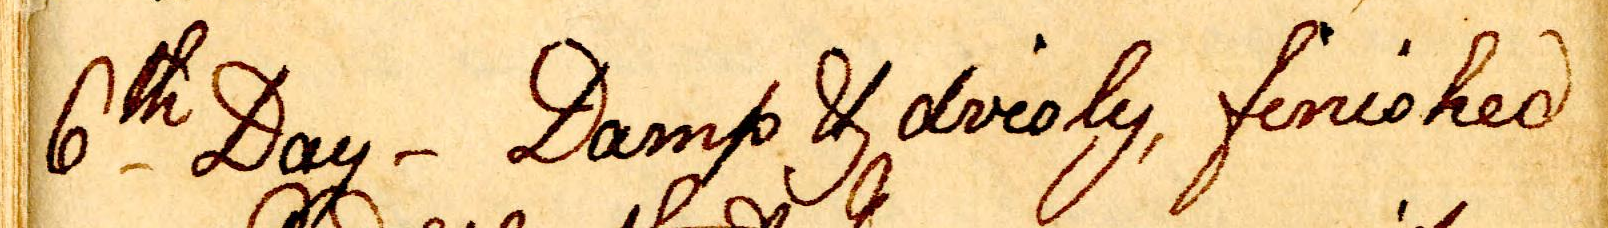6^th Day- Damp & drisly finished
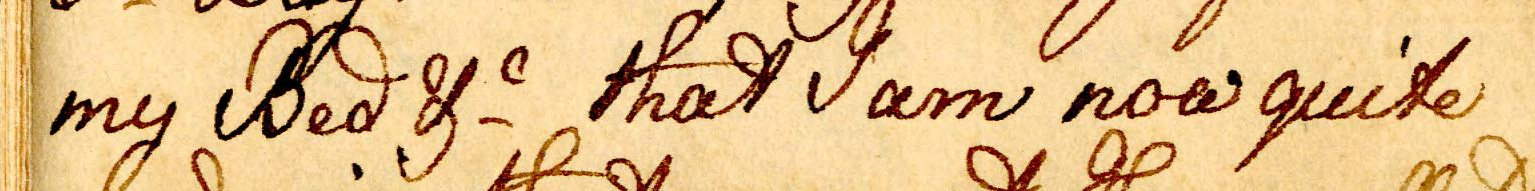my Bed &^c that I am now quite
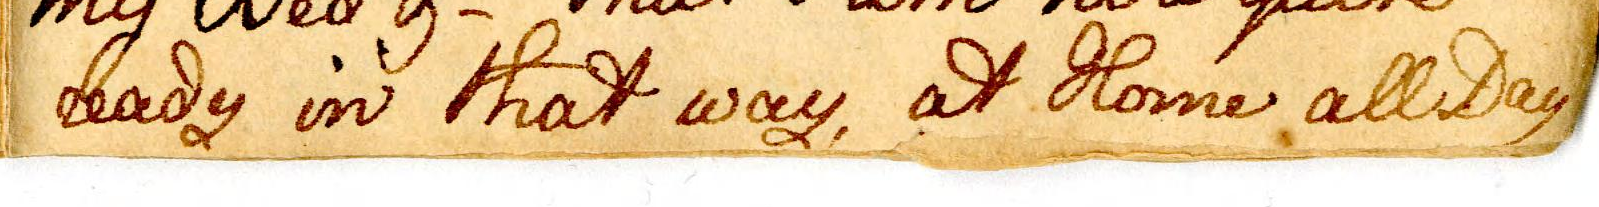ready in that way at Home all Day
